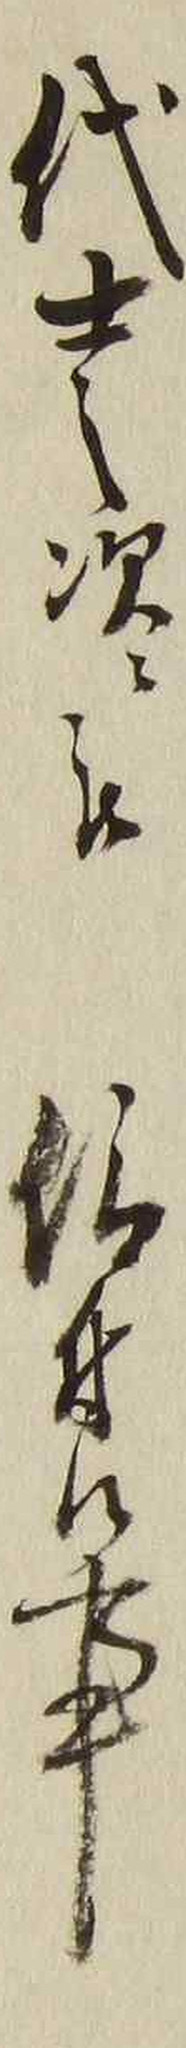代士之次ニ被仰付候事

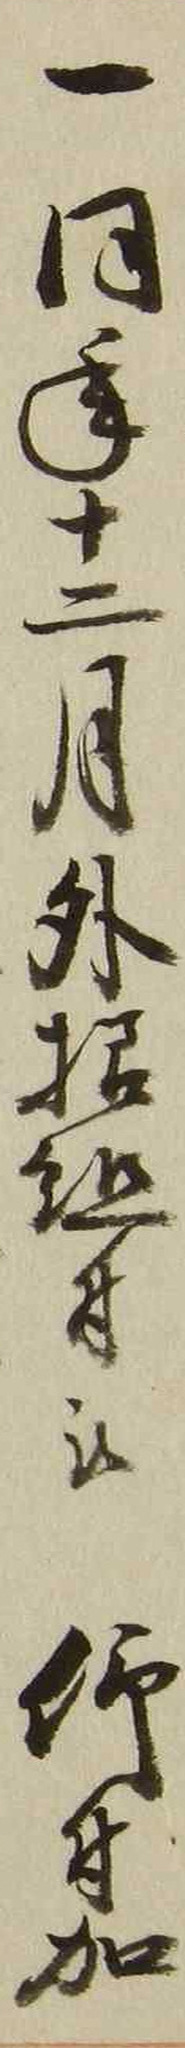一同年十二月外様組付被仰付加
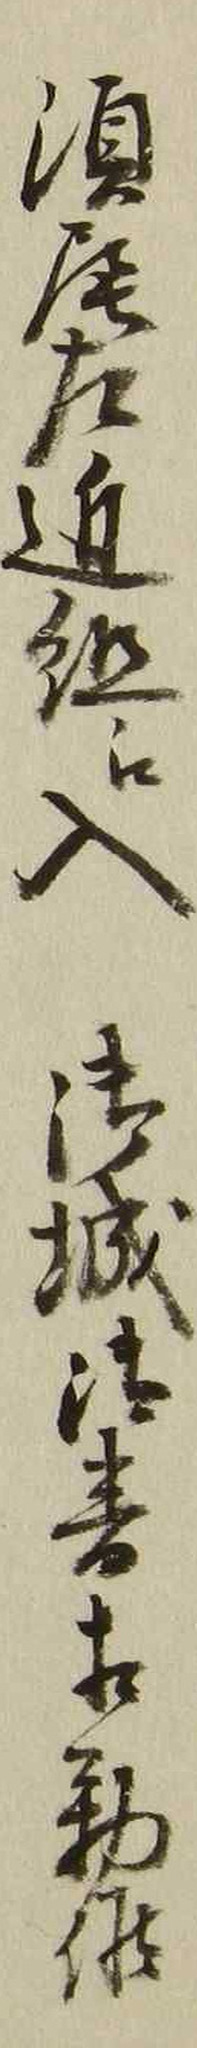須尾左近組江入御城御番相勤候
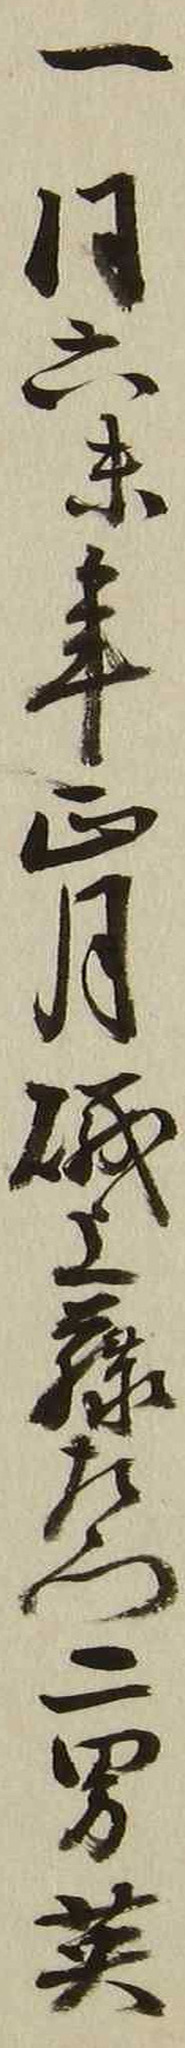一同六未年正月磯上藤左衛門二男英
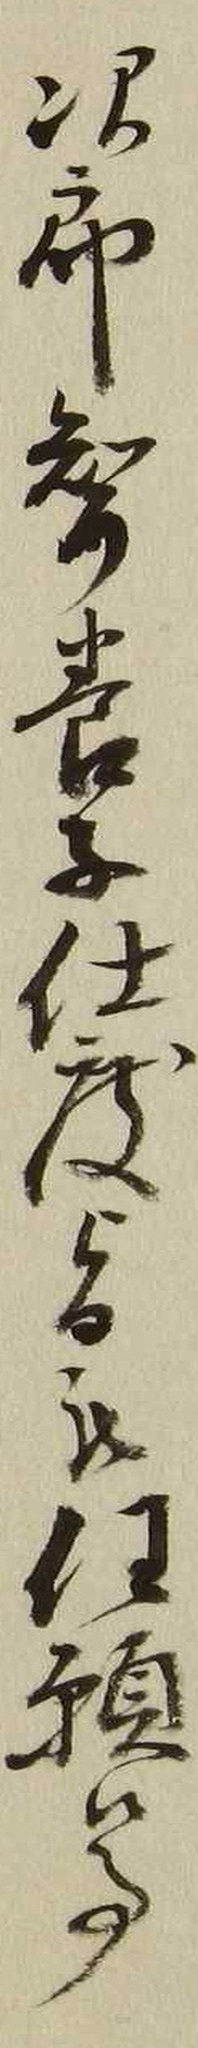次郎聟養子仕度旨被任願候事
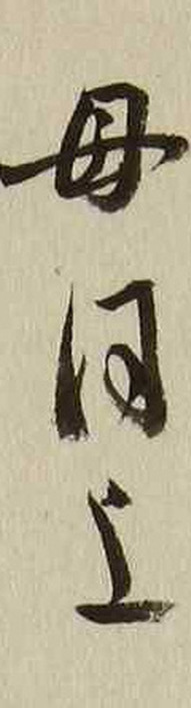母同上
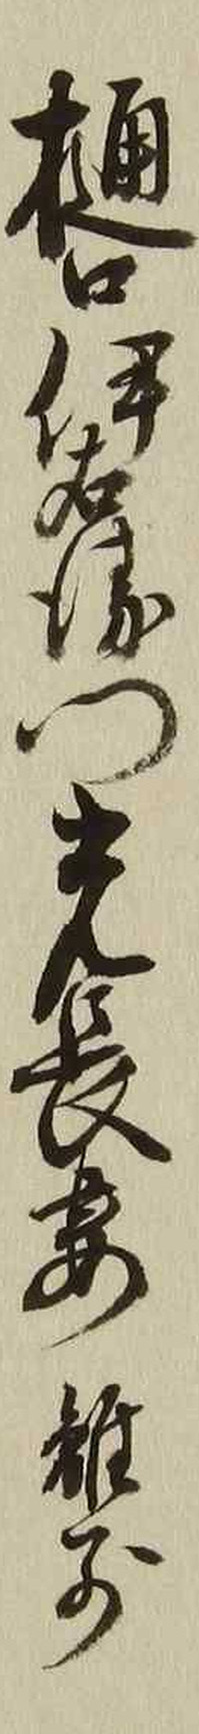樋口伊右衛門光長妻離別
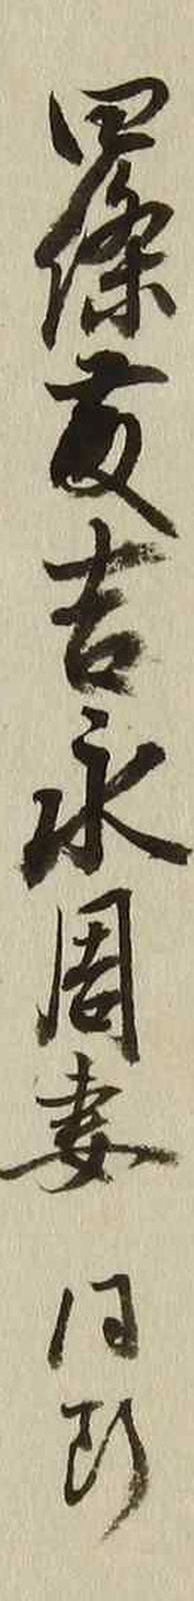四条藤吉永周妻同断
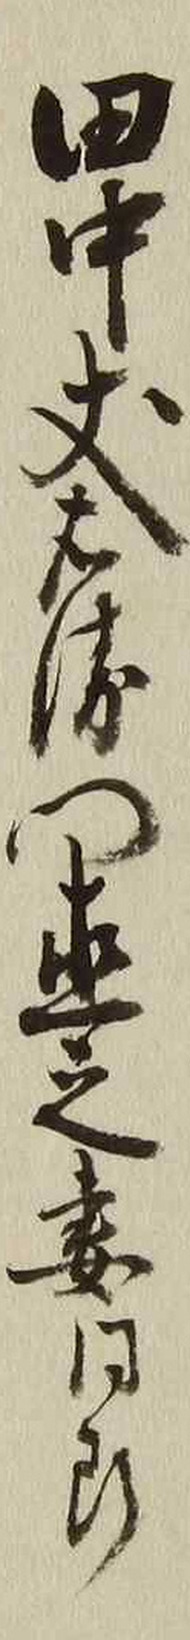女田中丈右衛門直之妻同断
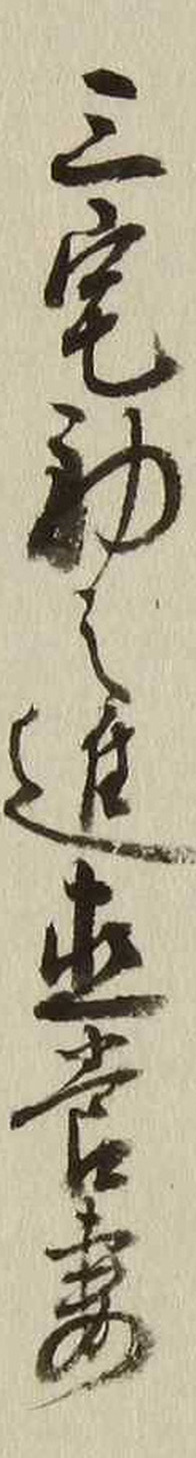三宅初之進直養妻
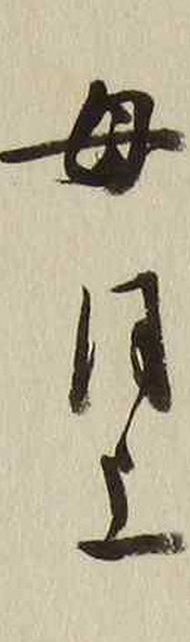母同上
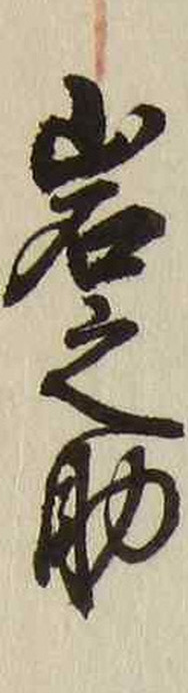岩之助
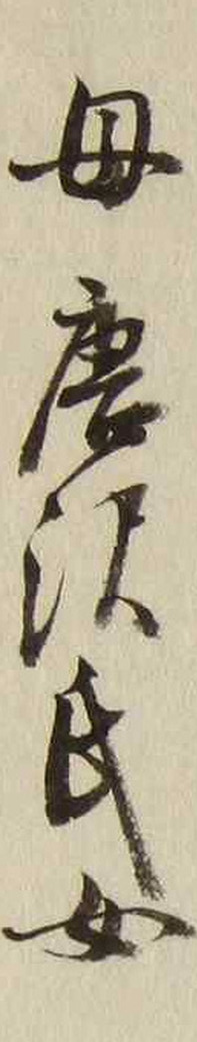母唐沢氏女

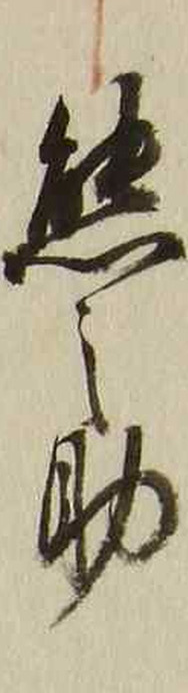熊之助
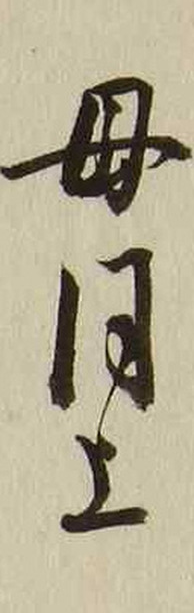母同上
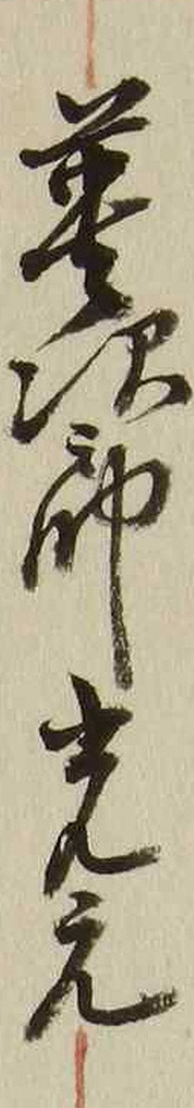英次郎光元
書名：諸士系譜　巻之27　い之部27
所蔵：会津若松市立会津図書館
